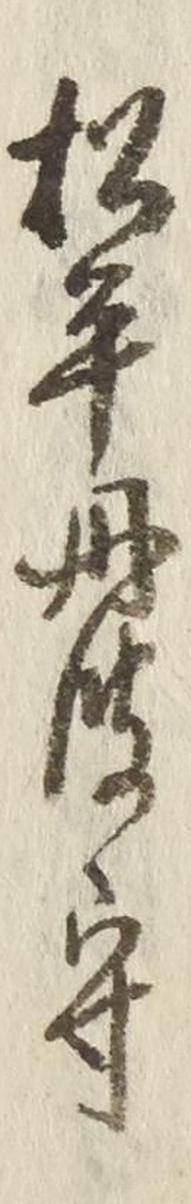松平丹波守
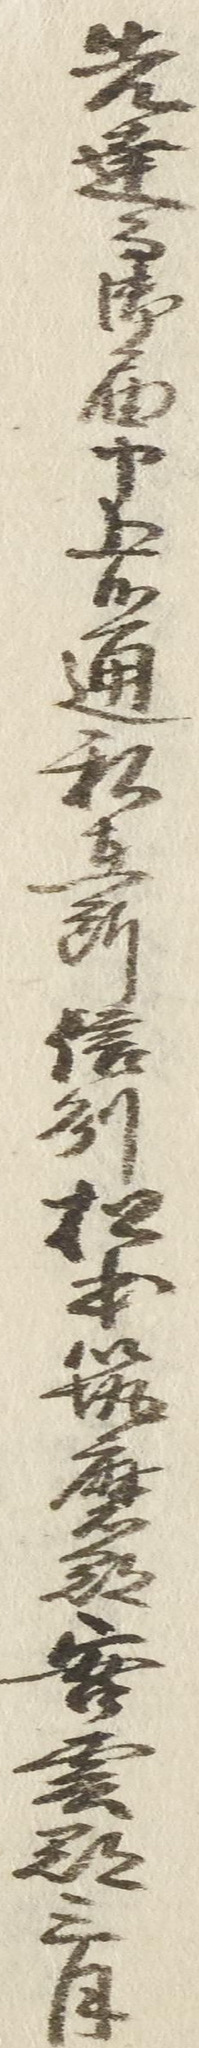先達而御届申上候通私在所信州松本筑摩郡安曇郡三月
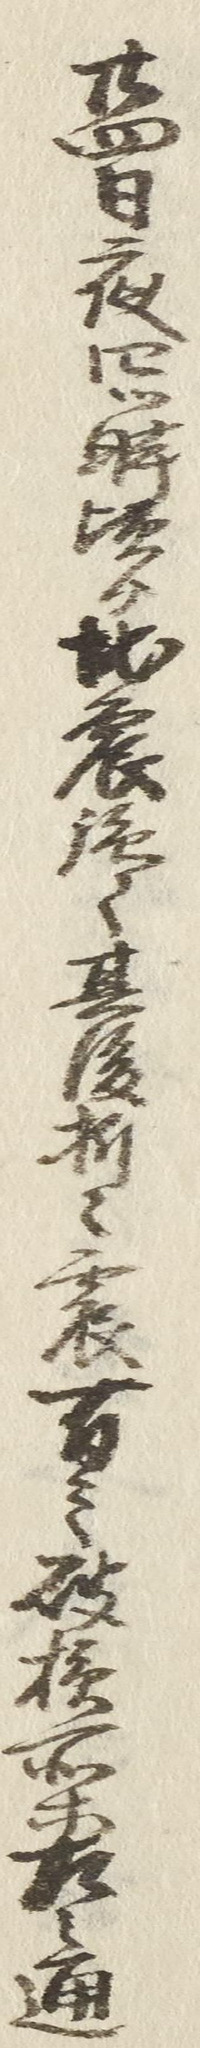廿四日夜四ッ時頃ゟ地震強く其後折々震有之破損所等左之通
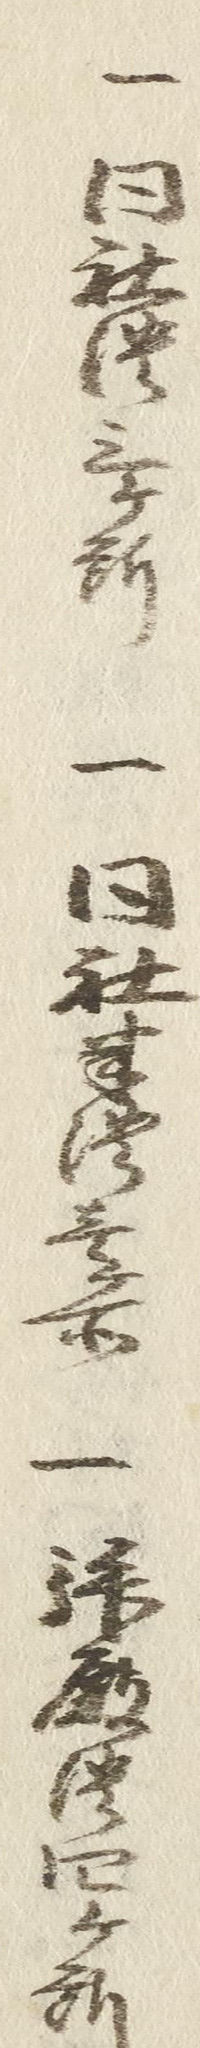一同社潰三ヶ所一同社半潰壱ヶ所一拝殿潰四ヶ所
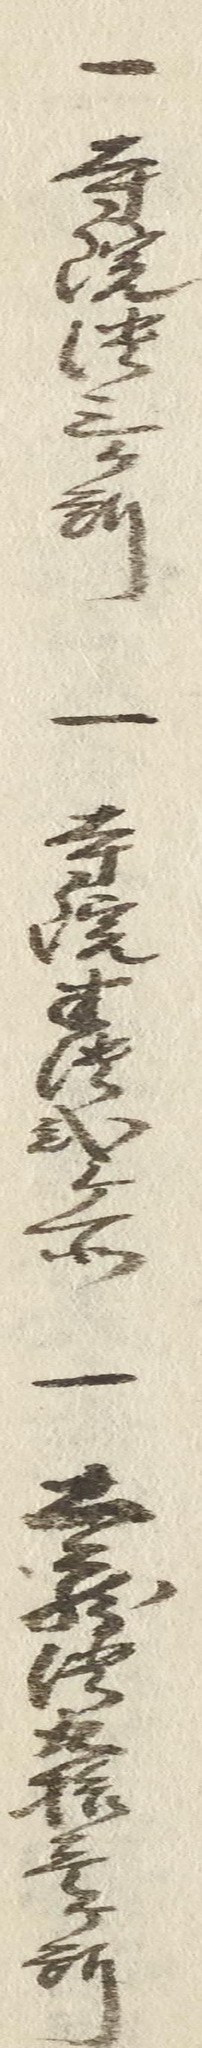一寺院潰三ヶ所一寺院半潰弐ヶ所一土蔵潰九拾壱ヶ所
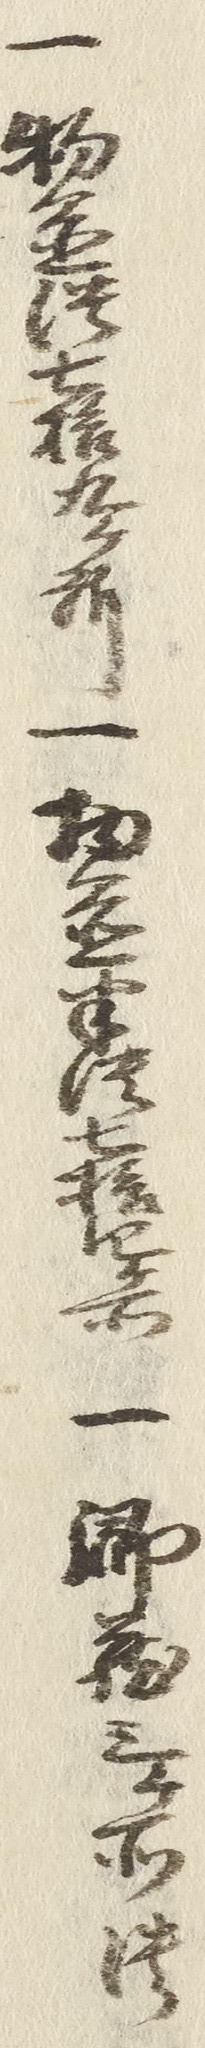一物置潰七拾九ヶ所一物置半潰七拾四ヶ所一郷蔵三ヶ所潰
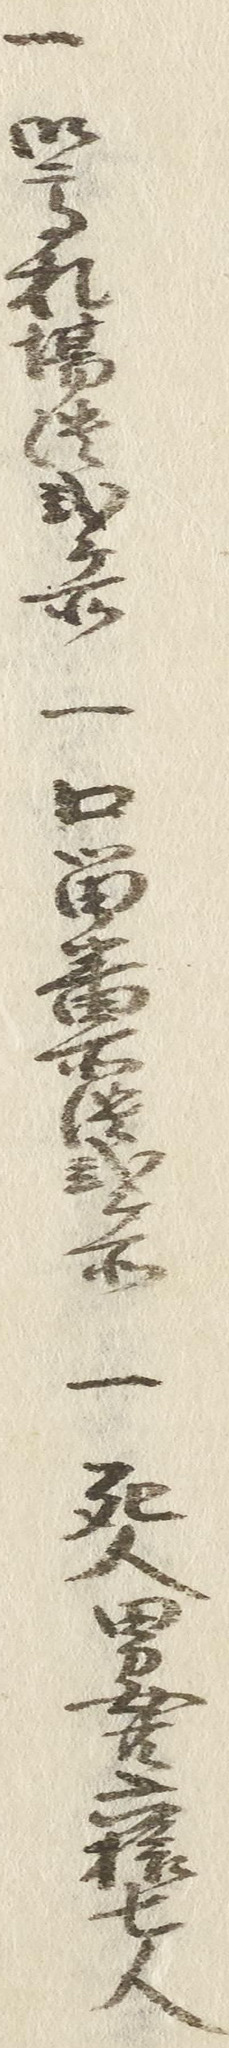一御高札場潰弐ヶ所一口留番所潰弐ヶ所一死人男女共六拾七人
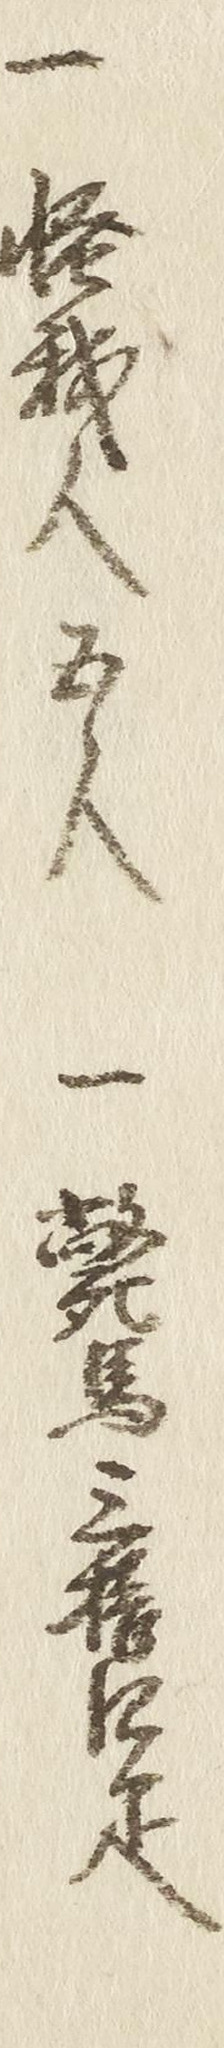一怪我人五人一弊死馬三拾四疋一
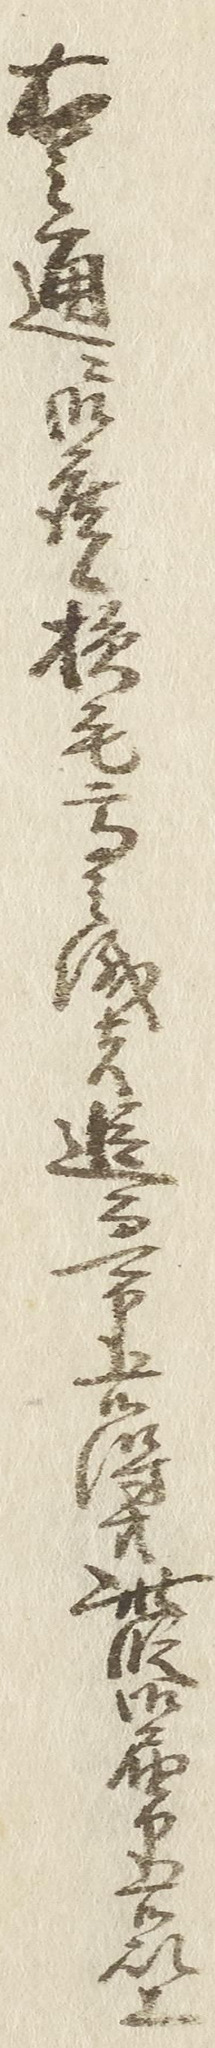右之通二御座候損毛高之儀は追而可申上候得共此段御届申上候以上
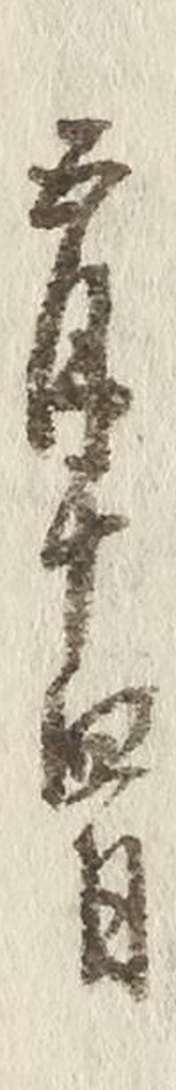五月十四日
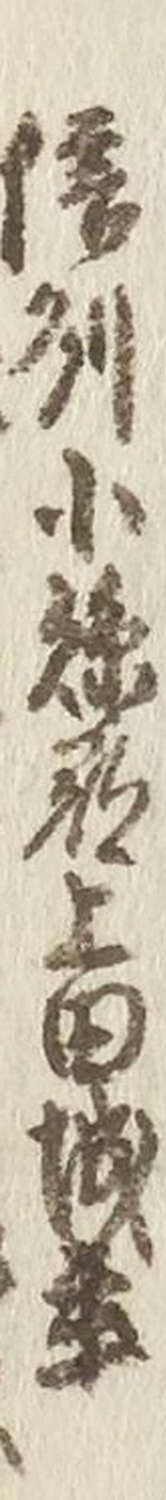信州小縣郡上田城主
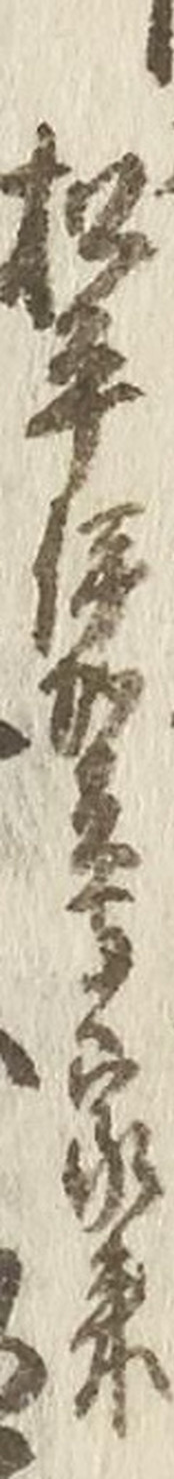松平伊賀守家来
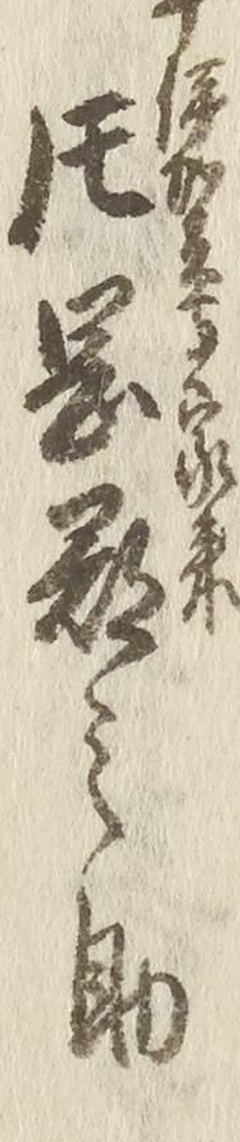片岡郡之助
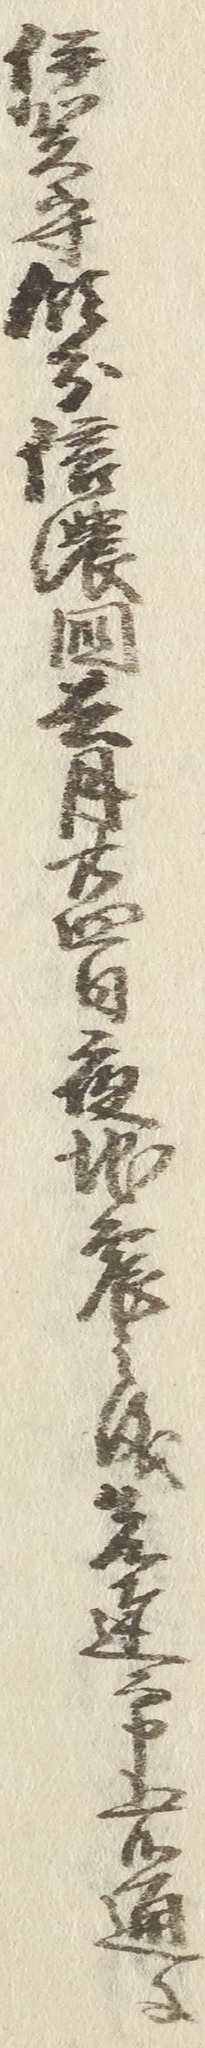伊賀守領分信濃国去月廿四日夜地震之儀先達而申上候通に
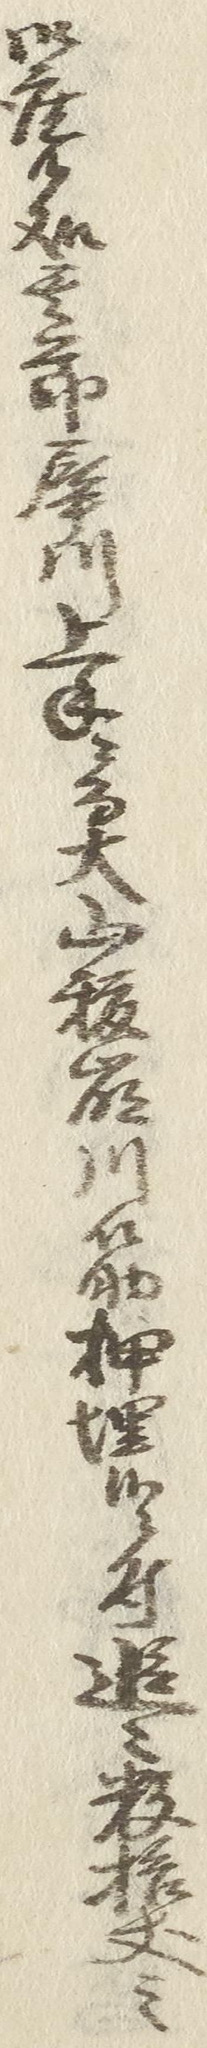御座候処其節犀川上手二而大山抜川筋押埋候二付追々数拾丈之
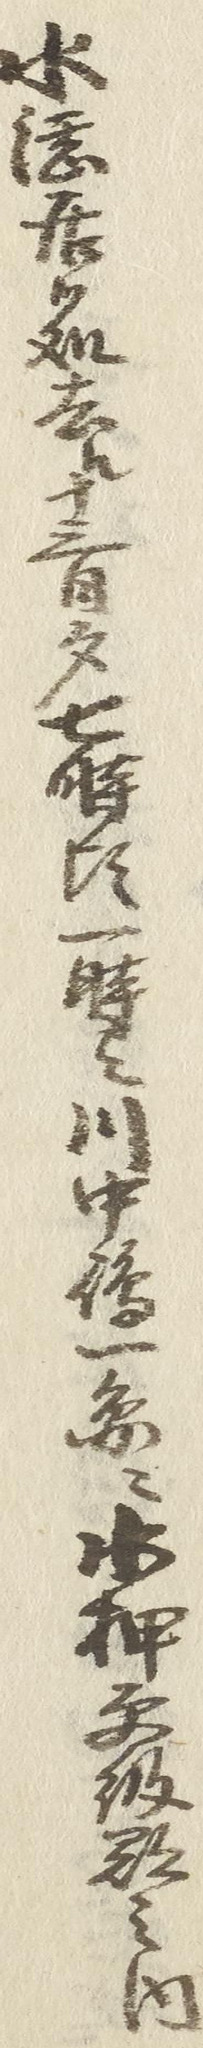水湛居候処去ㇽ十三日夕七時頃一時二川中嶋一円二水押更級郡之内
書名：従往古地震御届書記誌之一
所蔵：東京大学地震研究所図書室 Earthquake Research Institute Library, The University of Tokyo, JAPAN
